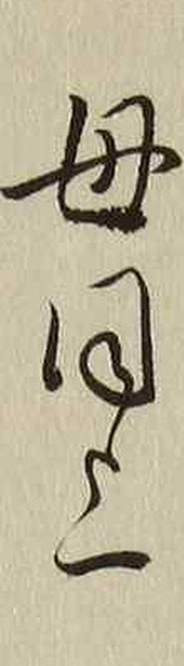母同上
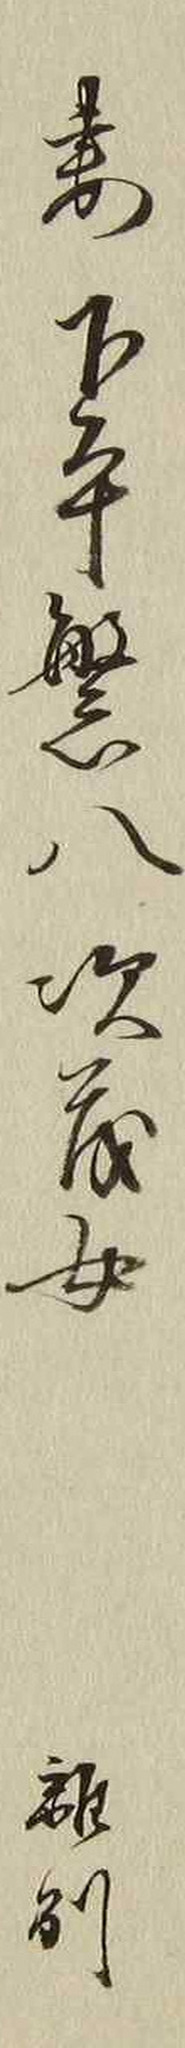妻下平繁八郎次茂女
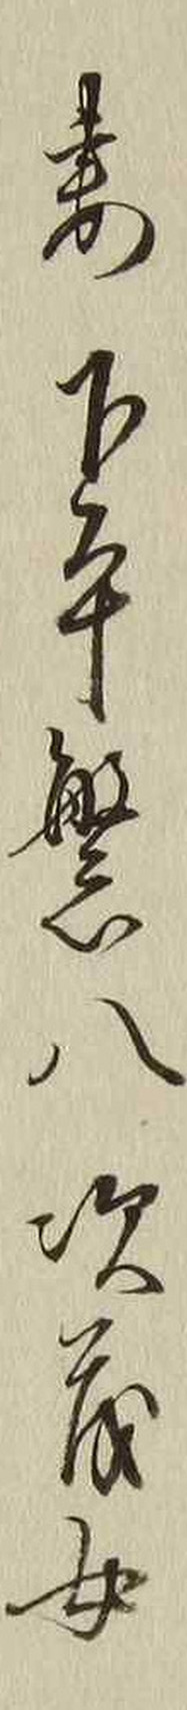妻下平繁八郎次茂女
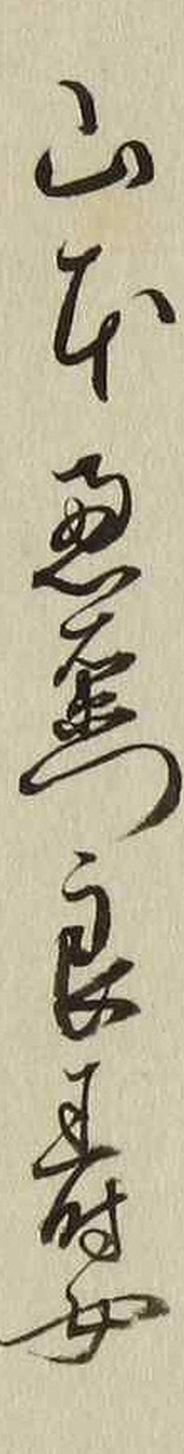山本恵右衛門良寿女
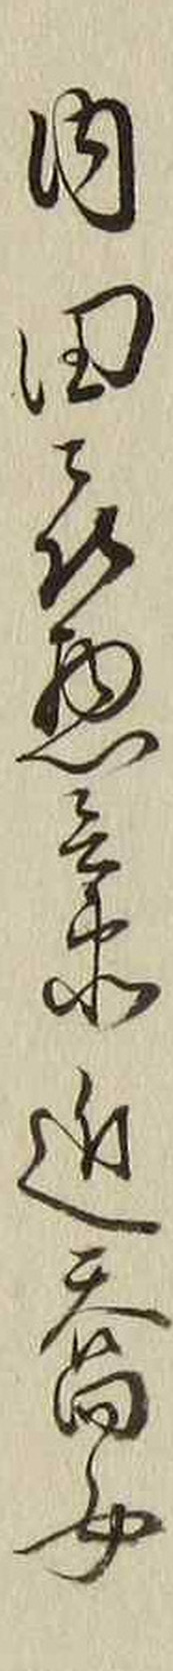内田喜惣兵衛近喬女
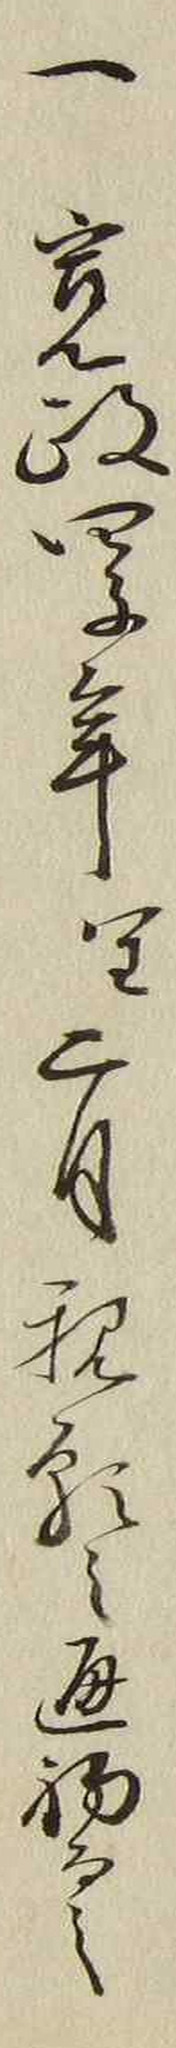一寛政四子年閏二月親願い之通初めて之

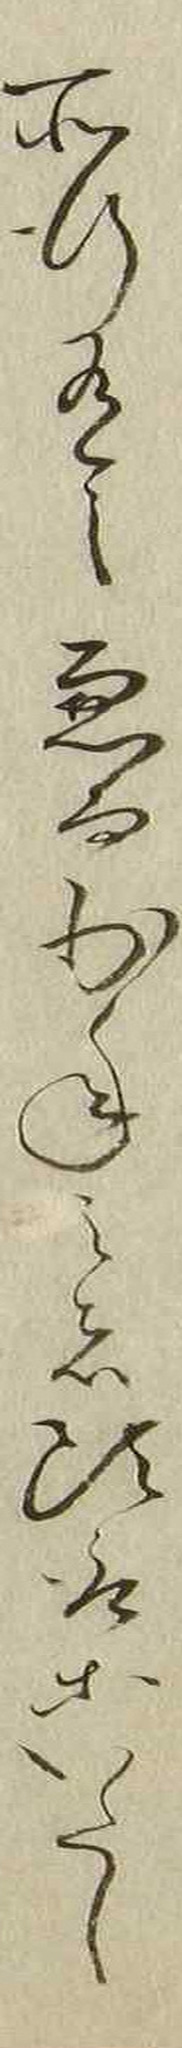所業有之兼ねて少年之者頭取等いたし
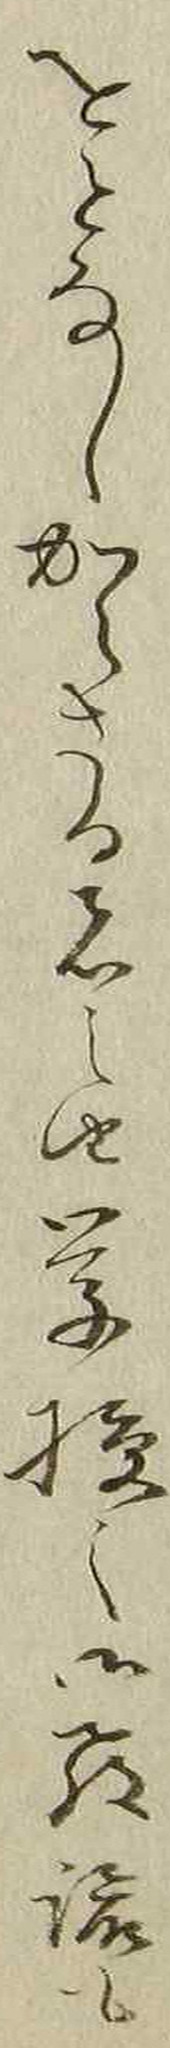をとなしからざる者之由学校之御教場も
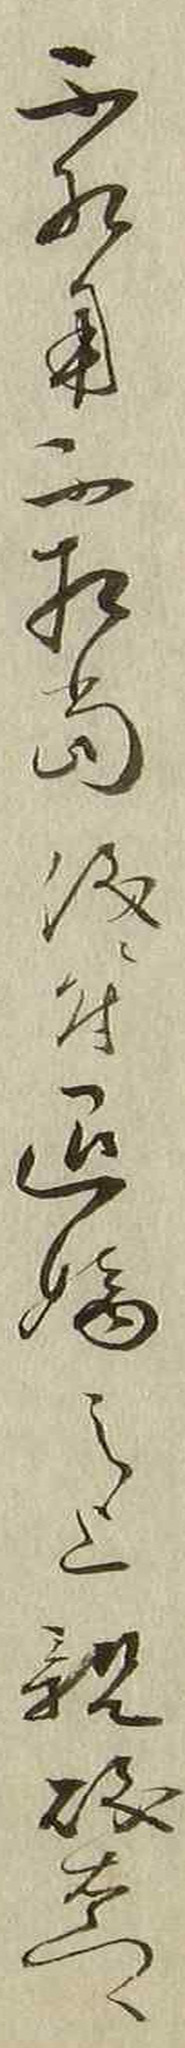相用いず不相当儀ニ付き退嫡之上親磯右衛門へ
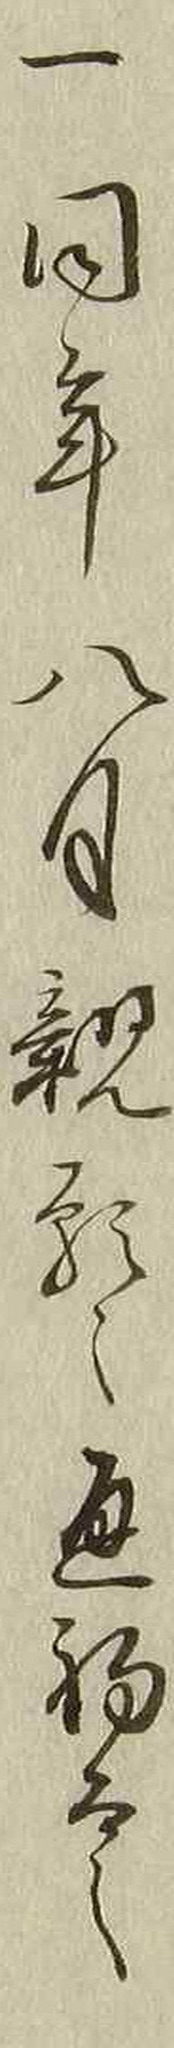一同年八月親願い之通初めて之
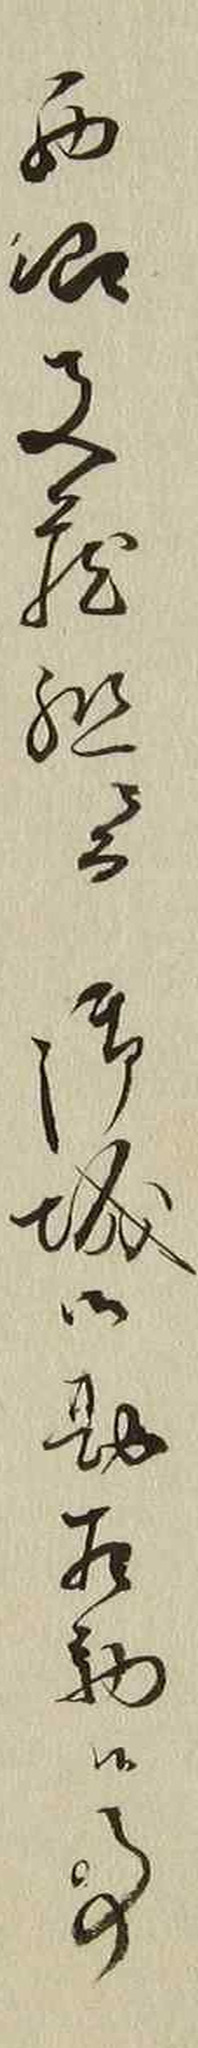西郷文蔵組ニて御城御勘相勤め候事
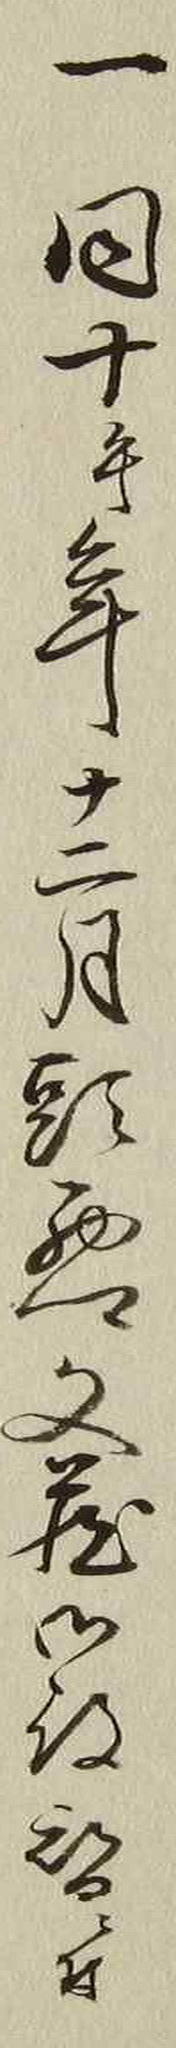一同十午年十二月頭西郷文蔵御役替えニ付き
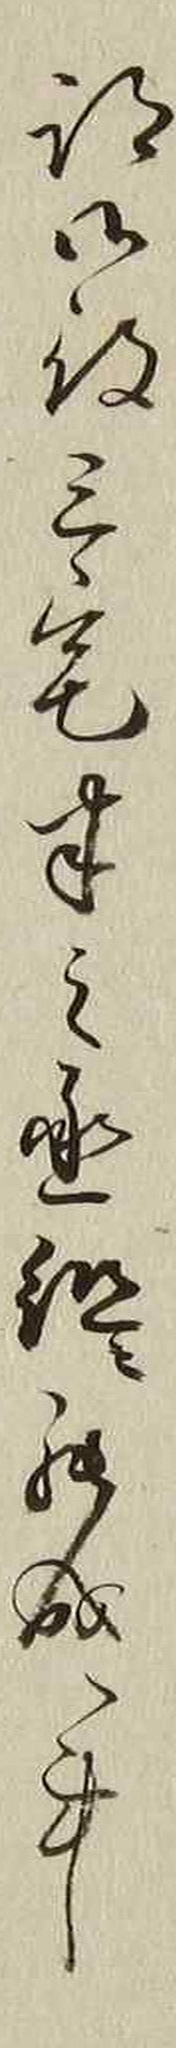跡御役三宅半之丞組ニ罷り成り候事
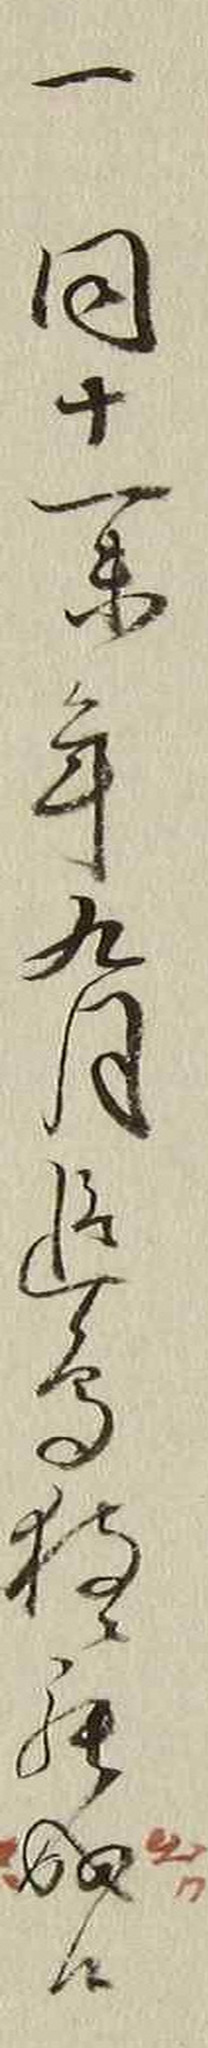一同十一未年九月追鳥狩ニ罷り出で候
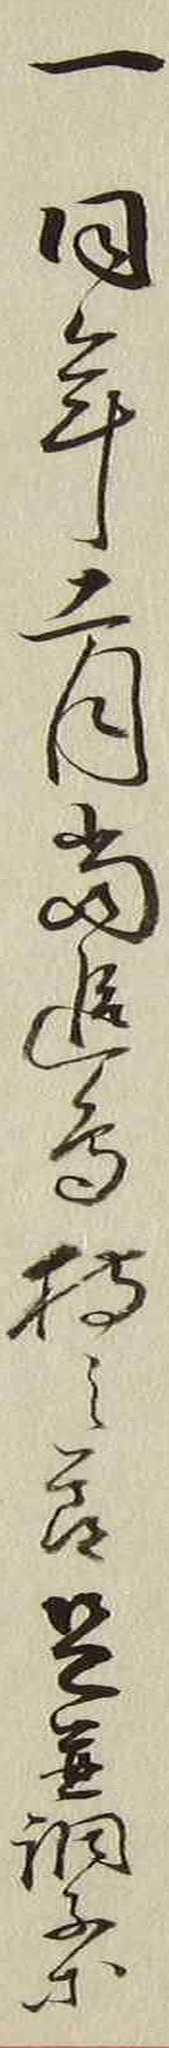一同年十一月当追鳥狩之節足並調子等
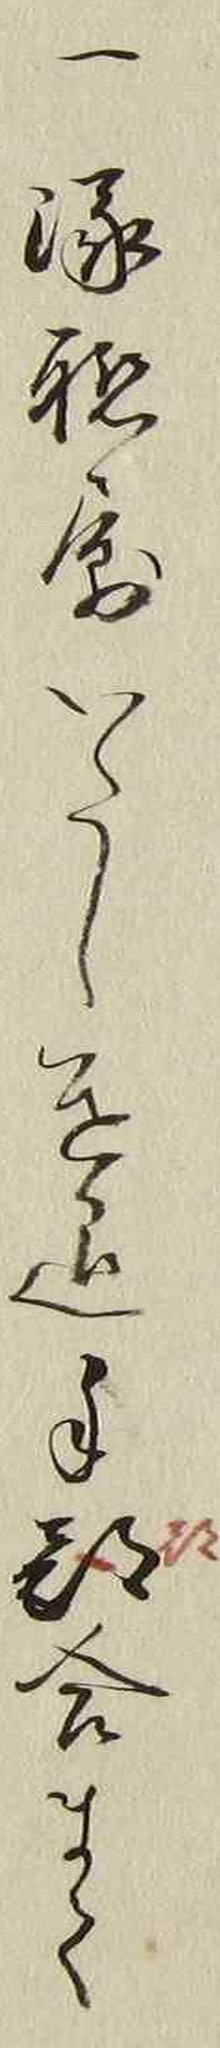一隊聯属いたし退手遣し都合まで
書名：諸士系譜　巻之20　い之部20
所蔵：会津若松市立会津図書館
